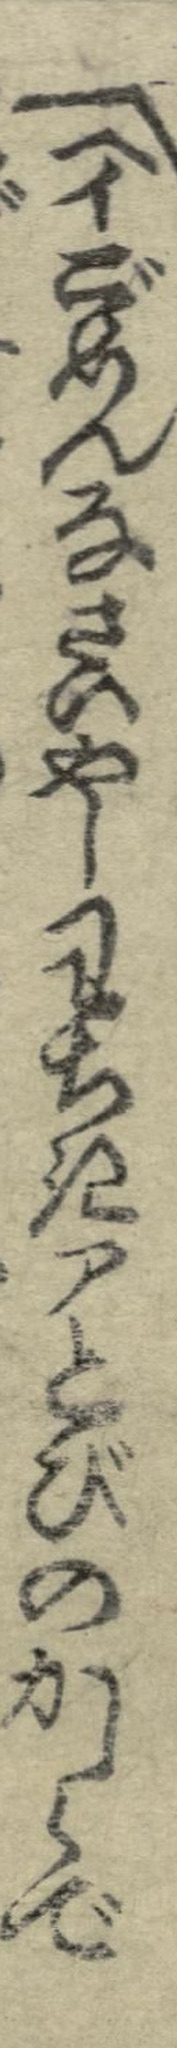〽ヘイごめんなさいやしわちきアとびのかしらで
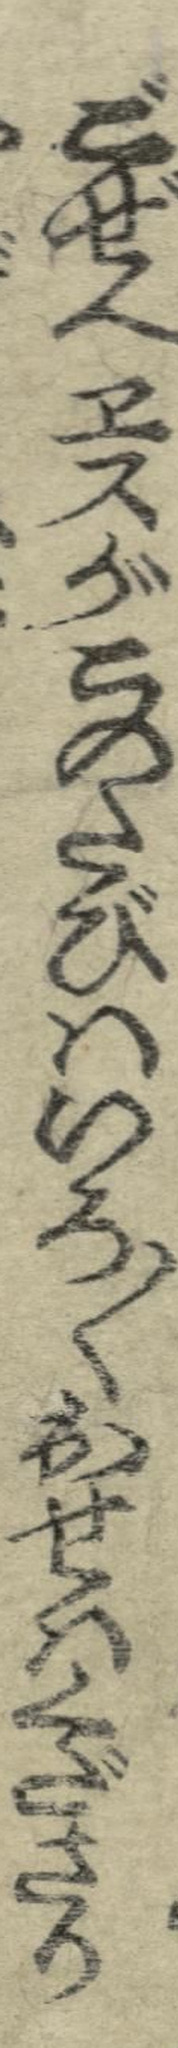ごぜへヱスがこのたびはいろ〳〵おせはくださり
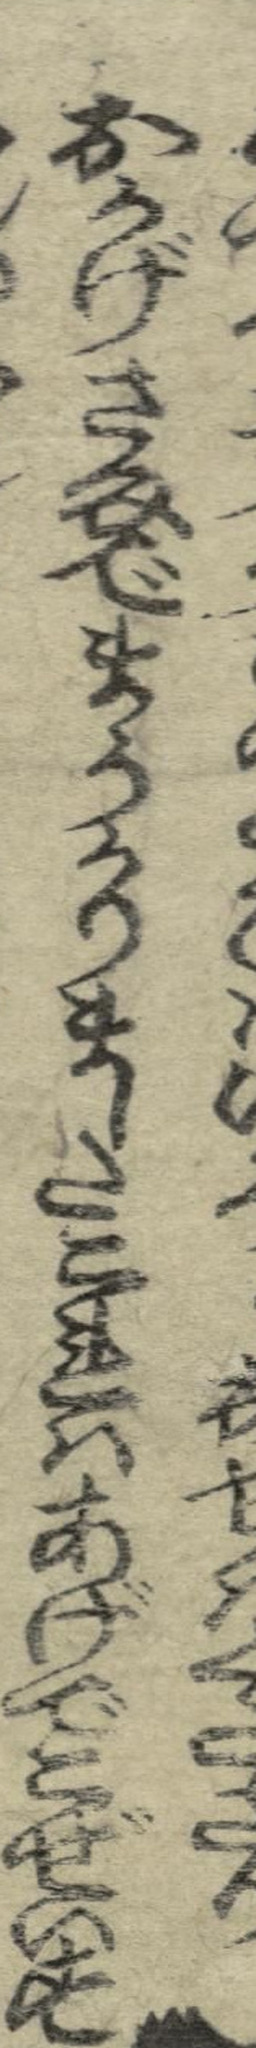おかげさまでまうかりましたこれはあげでこぜはす
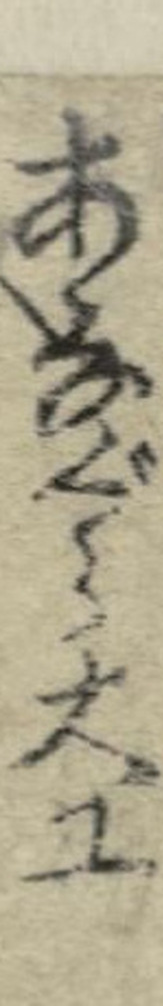あなぐら大工
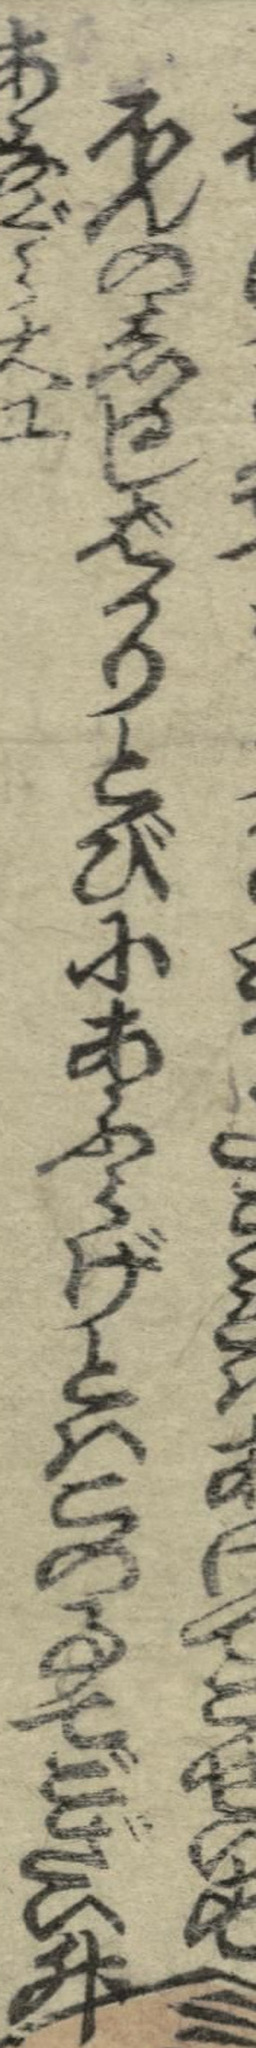ほんのしるしばかりとびにあふらげとはこの事てござい升
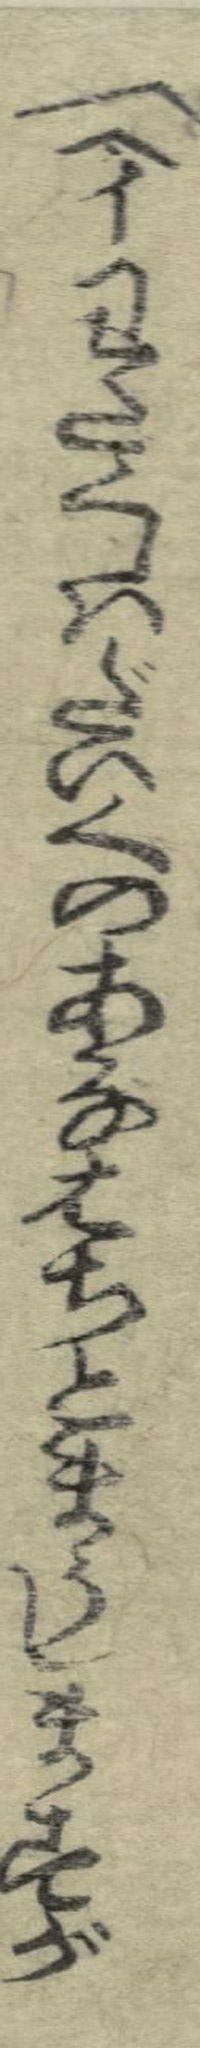〽ヘイわたくしはだいくのあなはちとまうしますが
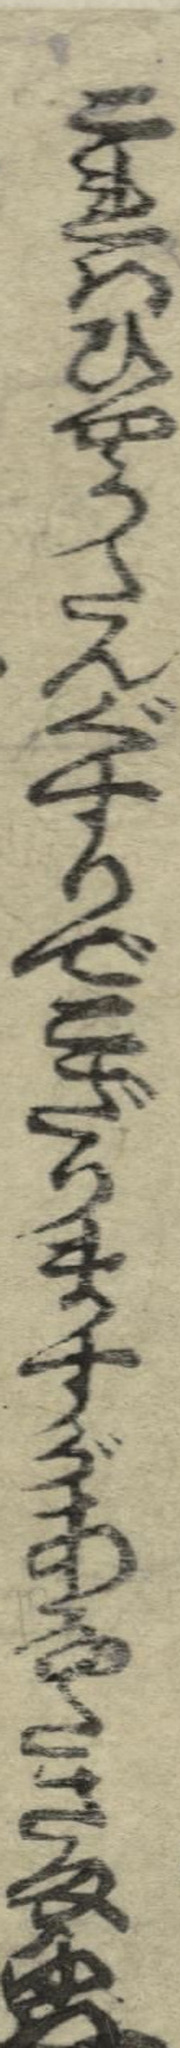これはひやうたんぐすりでこざりますがあなたさまには
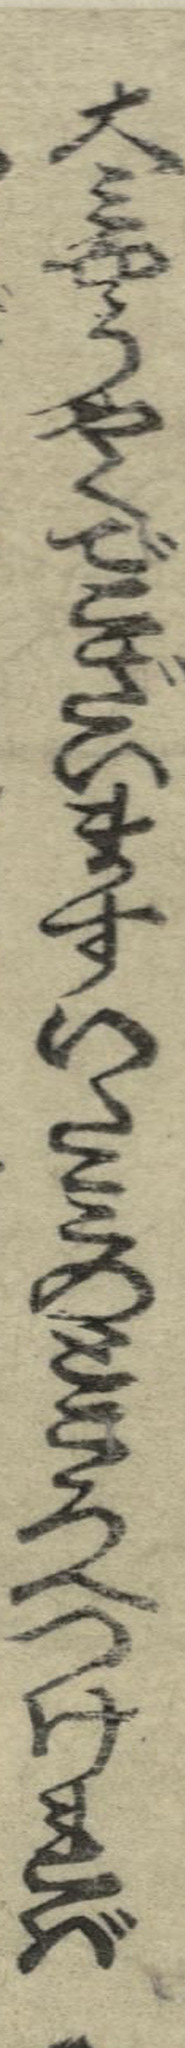大みやうやくでこざいますいたみのところへつければ
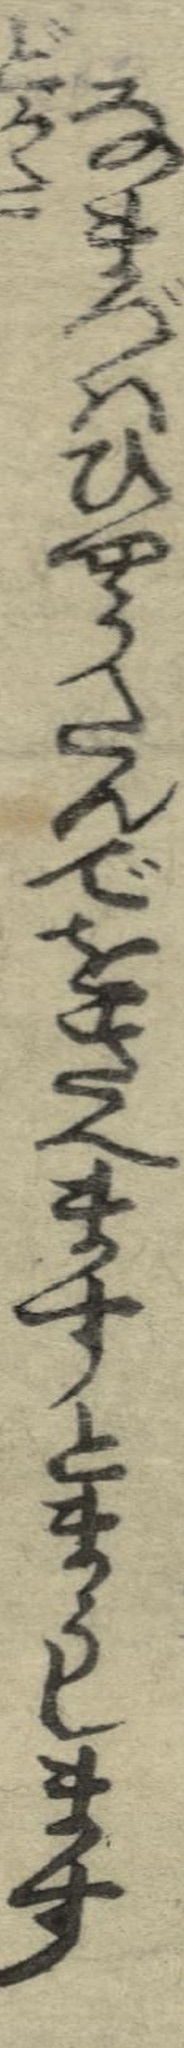なまづはひやうたんでをさへますとまうします
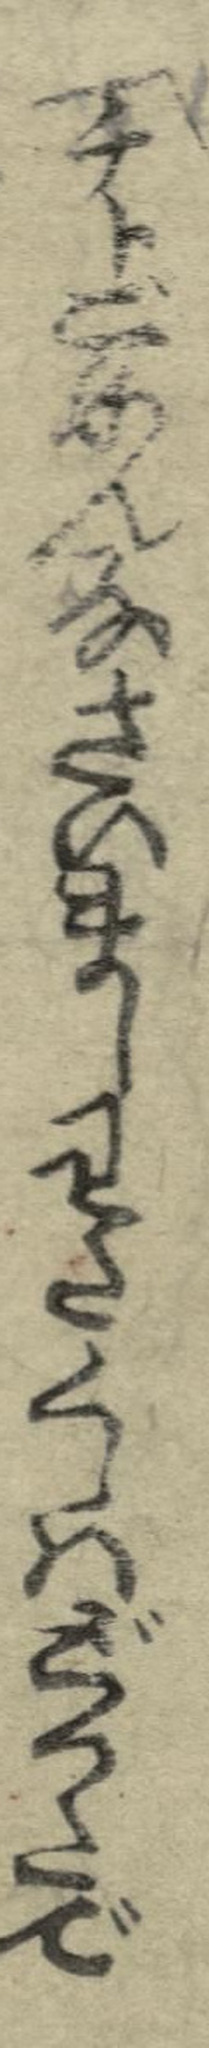〽チトごめんなさいましわたくしはどかたで
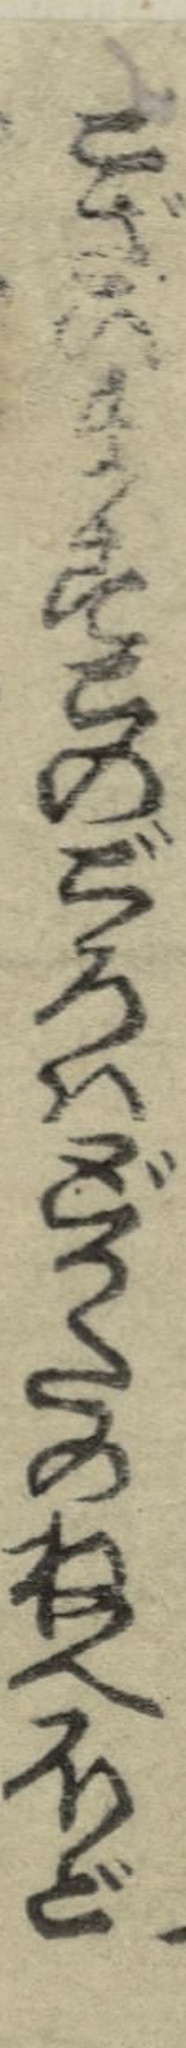こざいますこのごろはどかたのねへほど
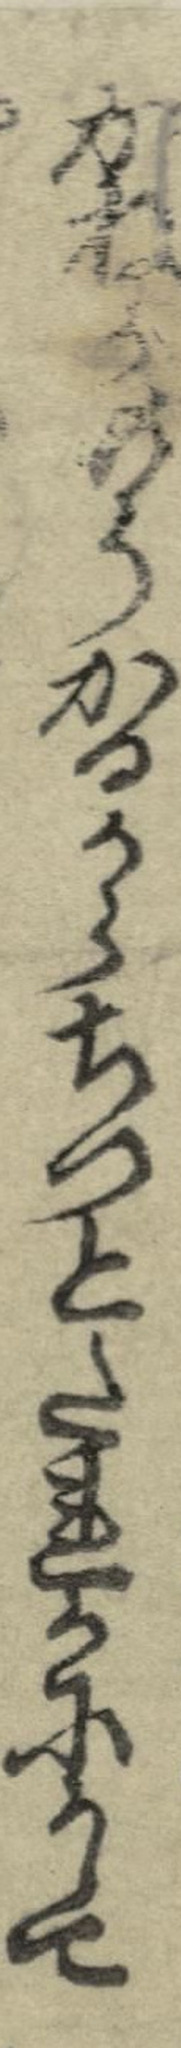かねかもうかるからちいとたれかにうて
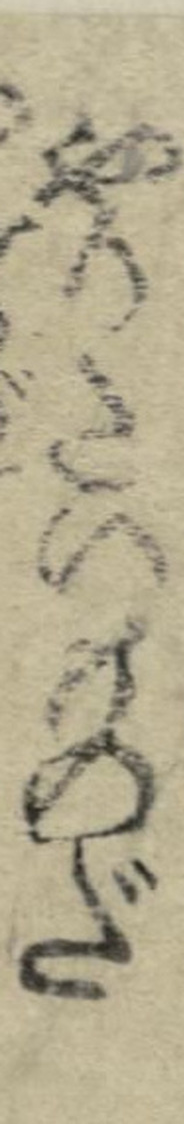やりたいものだ
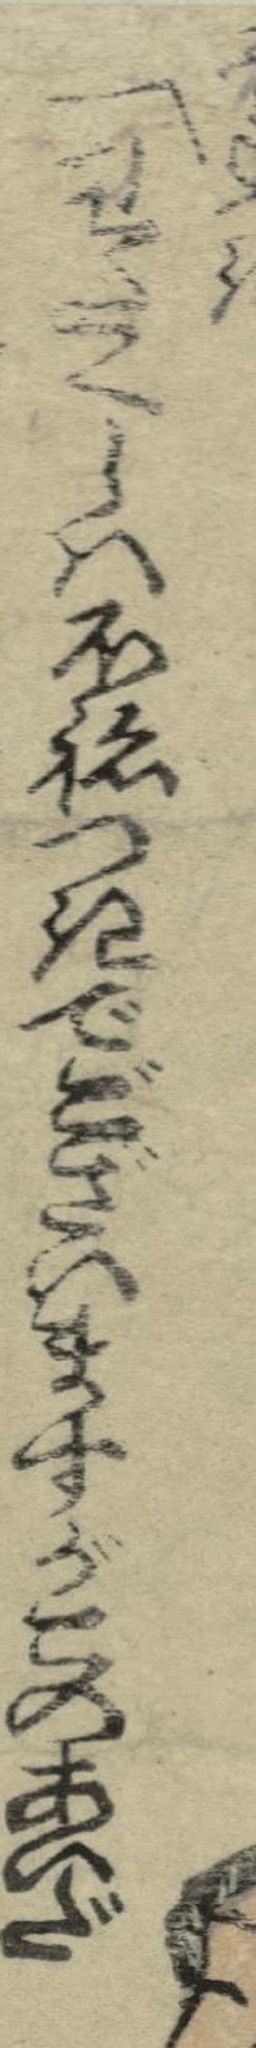〽わたくしはほねつきでございますがこのあいだ
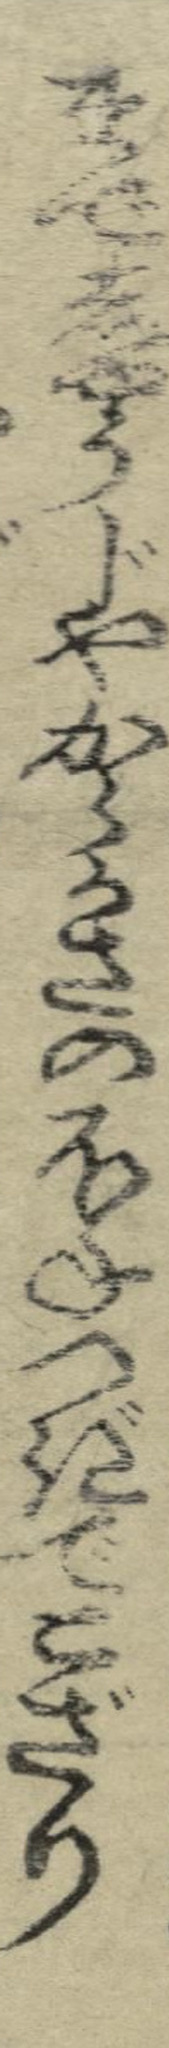までしやうじやからかさのほねつぎでこざり
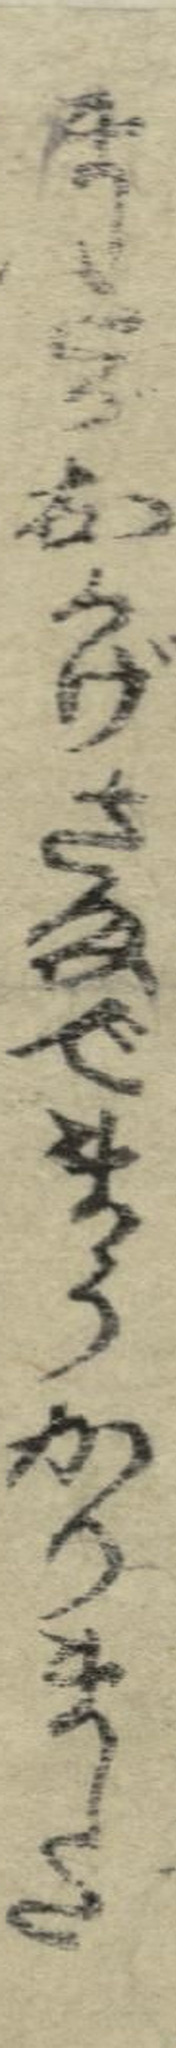ましたかおかげさまでまうかりました
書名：[鯰への見舞い]
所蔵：東京大学地震研究所図書室 Earthquake Research Institute Library, The University of Tokyo, JAPAN
